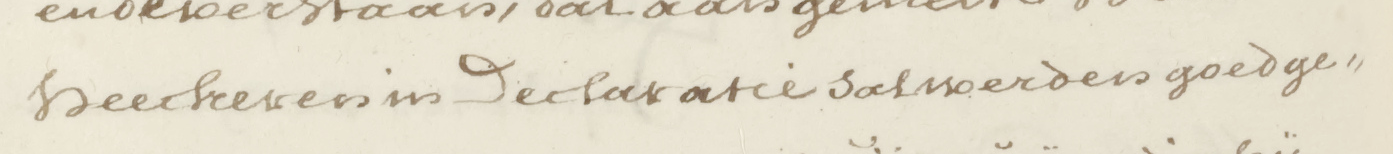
Heeckeren in Declaratie sal werden goedge„
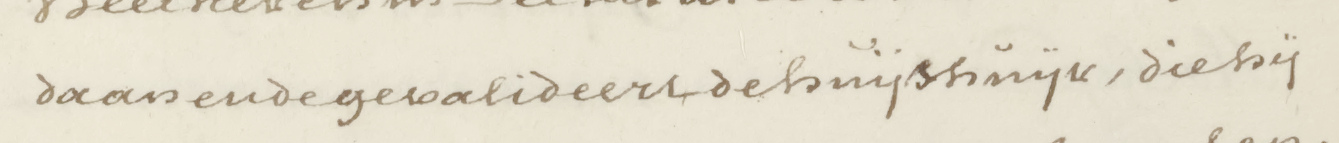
daan ende gevalideert de huijshuijr, die hij
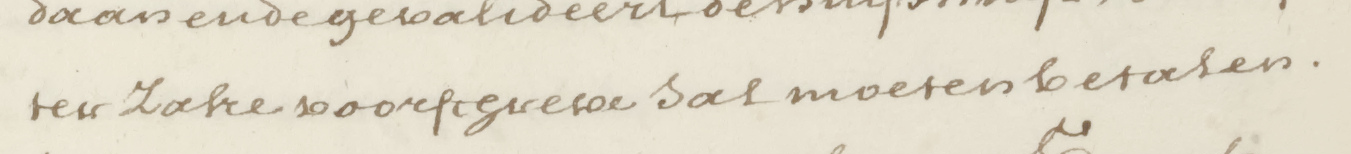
ter zake voorschreve sal moeten betalen.
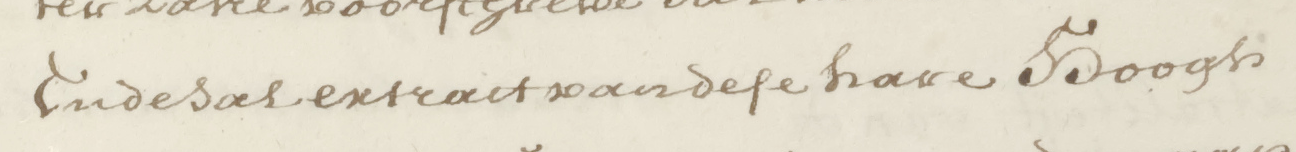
Ende sal extract van dese hare Hoogh
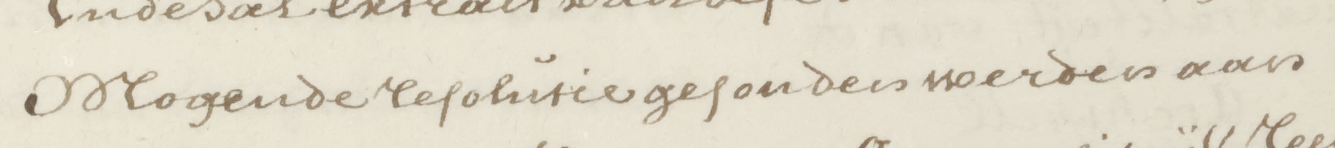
Mogende resolutie gesonden werden aan
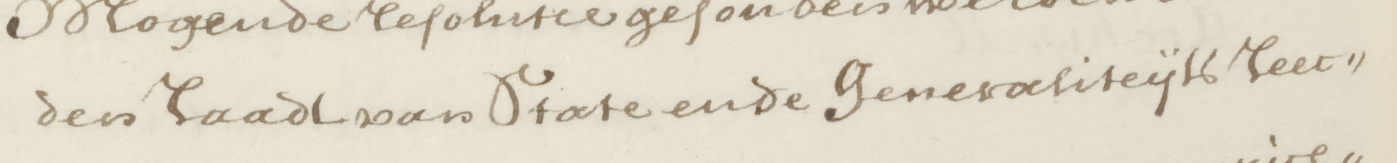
den Raadt van State ende Generaliteijts Reec„
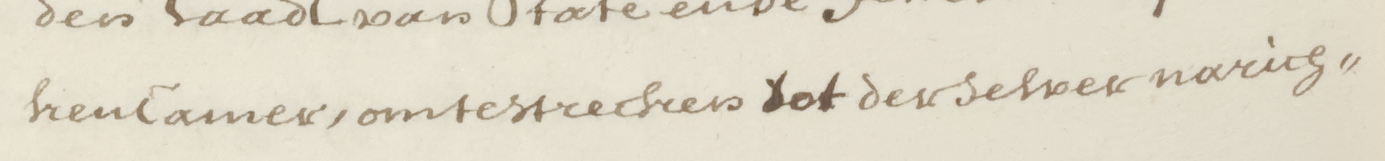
kenCamer, om te strecken tot derselver narich„
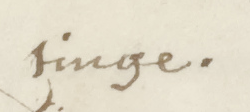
tinge.
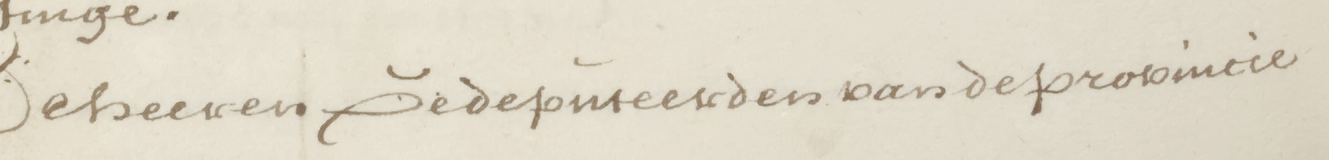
De heeren Gedeputeerden van de provincie
